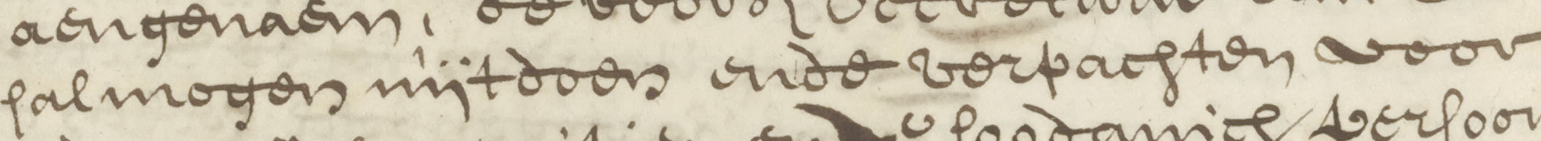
sal mogen uijtdoen ende verpachten voor
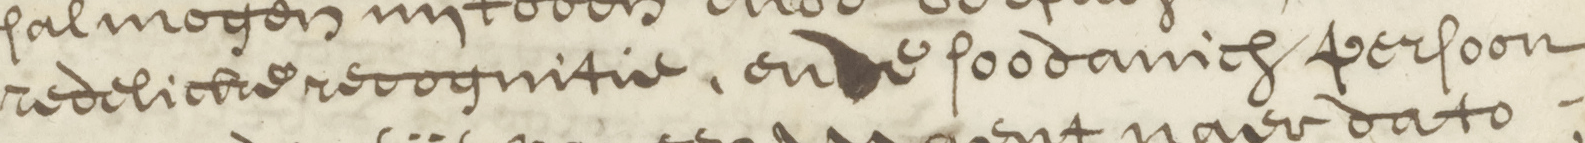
redelicke recognitie, ende soodanich persoon
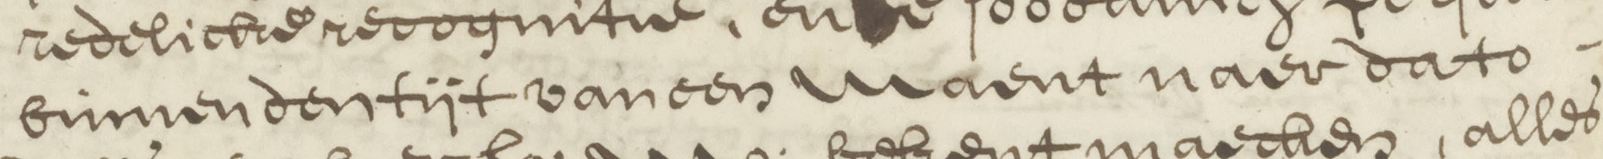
binnen den tijt van een Maent naer dato -
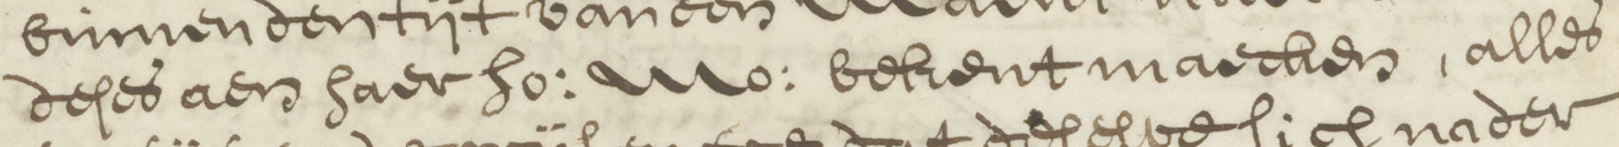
deses aen haer ho:Mo: bekent maecken, alles
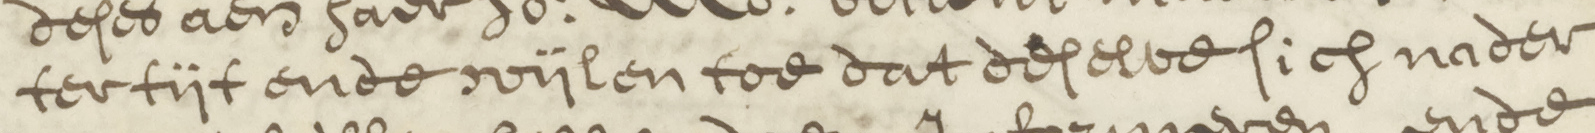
ter tijt ende wijlen toe dat deselve sich nader
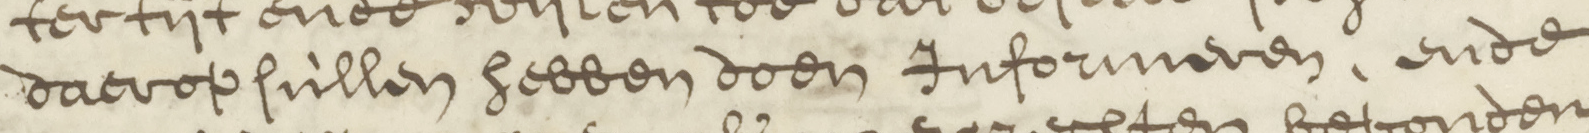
daerop sullen hebben doen Informeren, ende
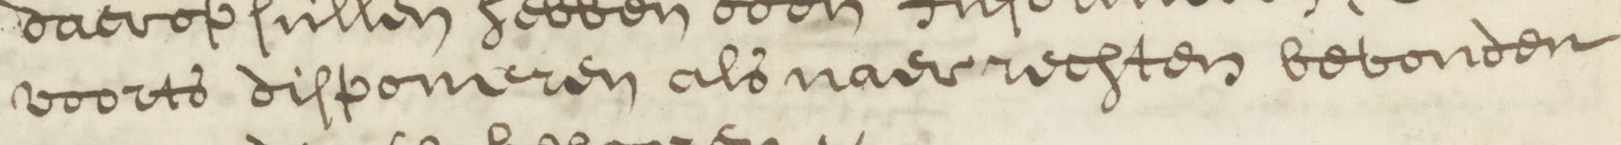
voorts disponeren als naer rechten bevonden
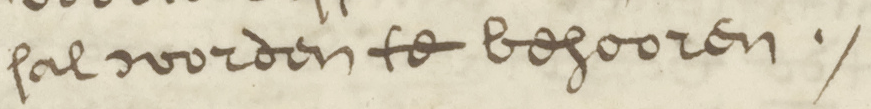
sal worden te behooren.
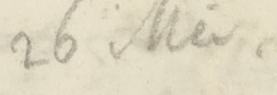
26 Mei,
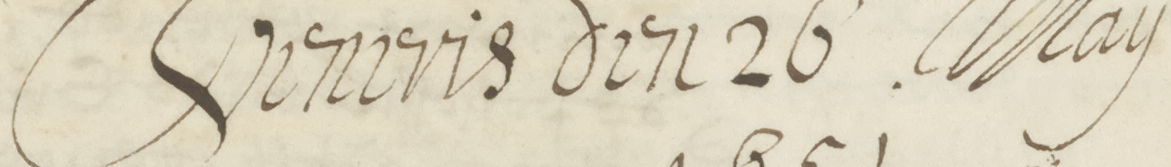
Veneris den 26e. Maij
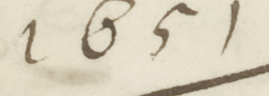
1651
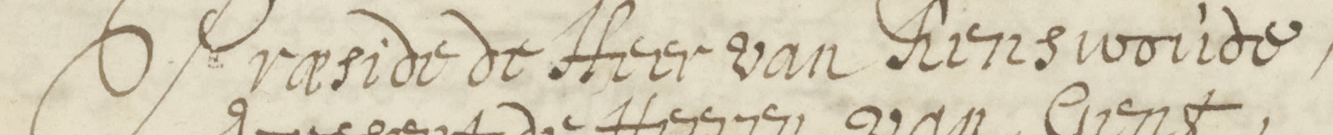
Præside de Heer van Renswoude,
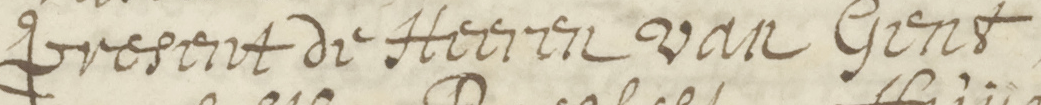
present de Heeren van Gent,
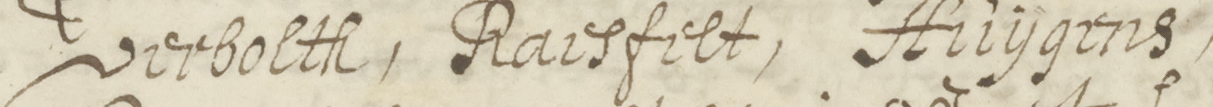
Verbolth, Raesfelt, Huijgens,
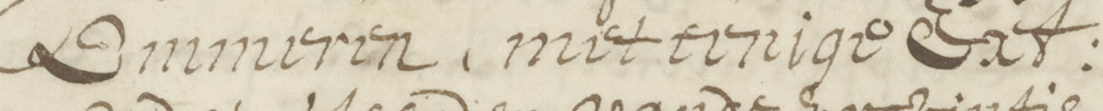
Ommeren, met eenige Exts:
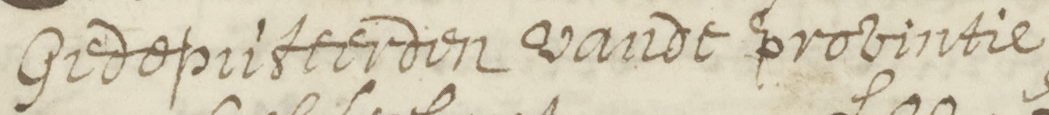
Gedeputeerden vande provintie
